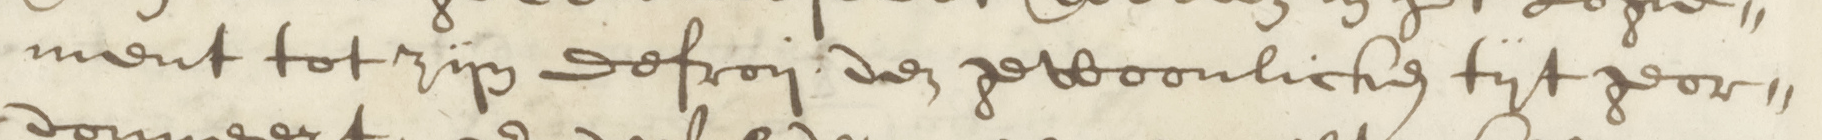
ment tot zijn defroy den gewoonlicken tijt geor„
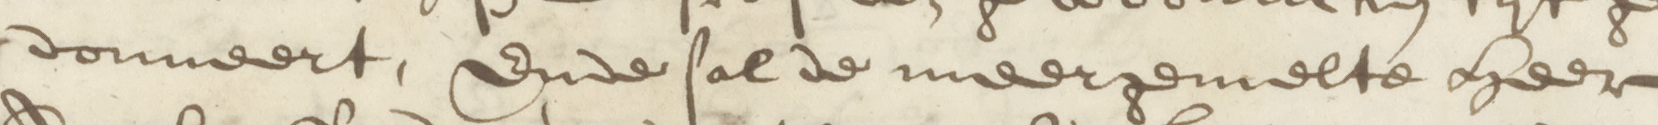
donneert. Ende sal de meergemelte heer
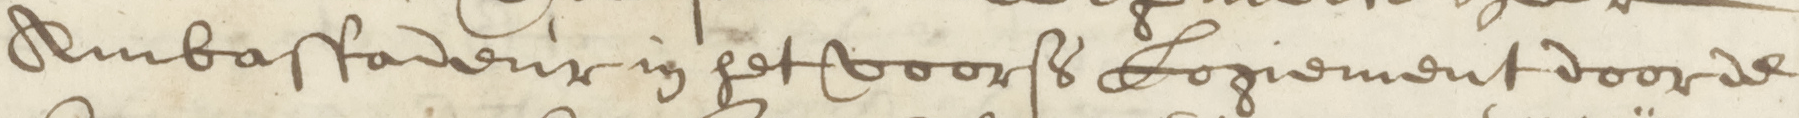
Ambassadeur in het voorsz Logiement door de
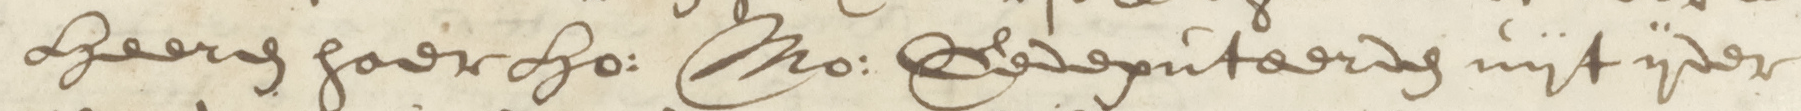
heeren haer Ho: Mo: Gedeputeerden uijt ijder
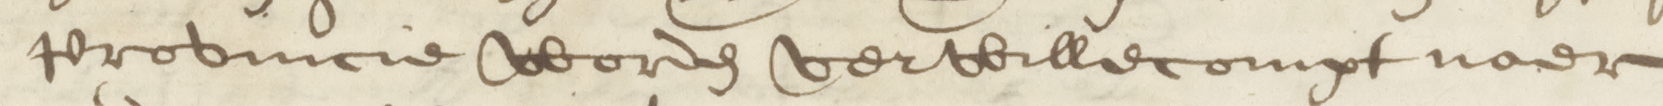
provincie worden verwillecompt naer
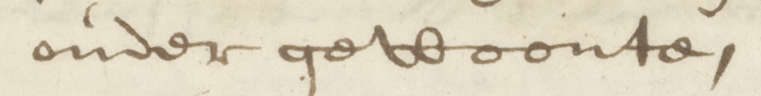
ouder gewoonte.
